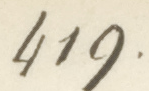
419.
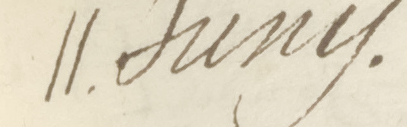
11. Junij.
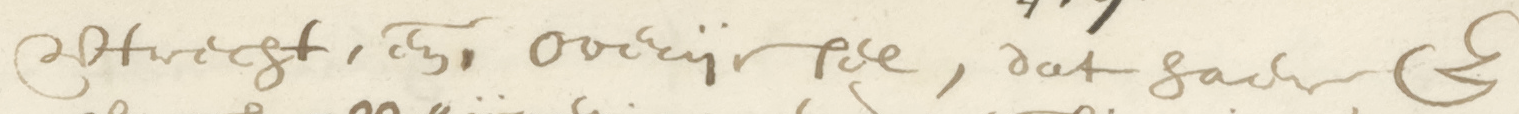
Utrecht, en Overijssel, dat haer E.
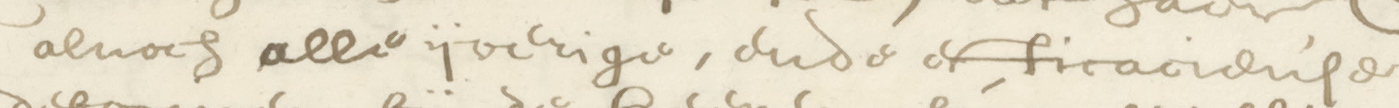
alnoch alle ijverige, ende efficacieuse
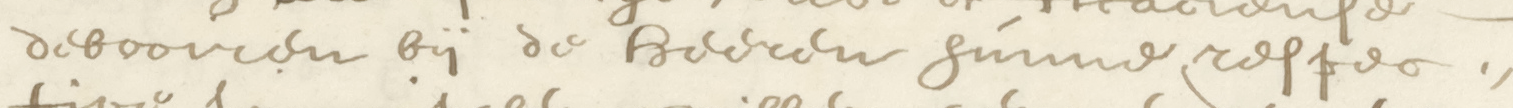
debvoiren bij de Heeren hunne respec„
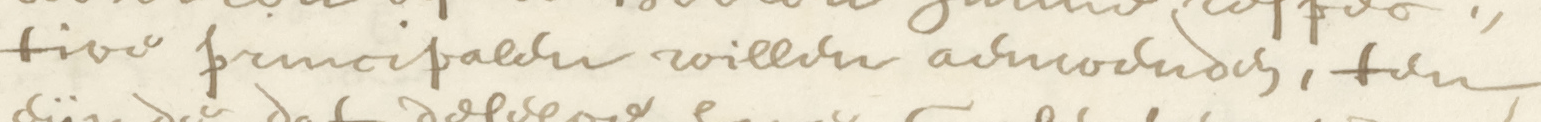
tive principalen willen aenwenden, ten
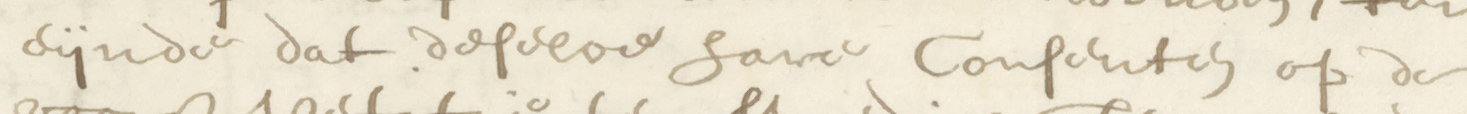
eijnde dat deselve hare Consenten op de
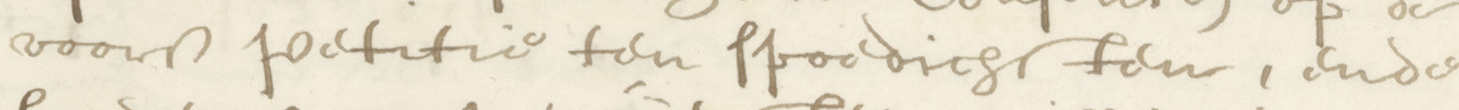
voors Petitie ten spoedichsten, ende
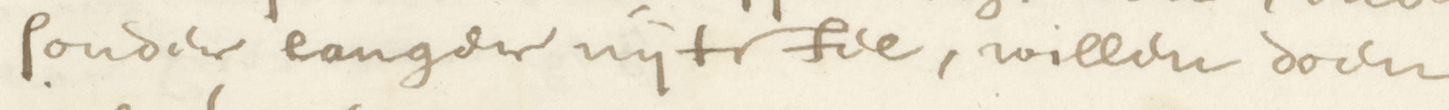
sonder langer uijtstel, willen doen
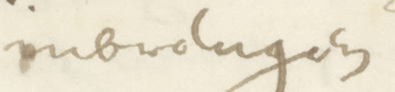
inbrengen.
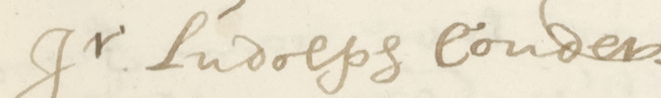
Jr. Ludolph Conders
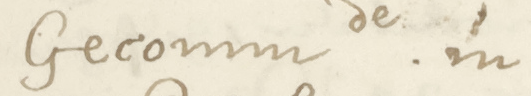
Gecommde. in
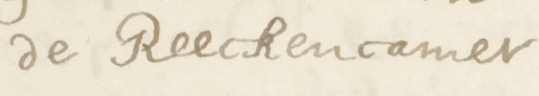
de Reeckencamer.
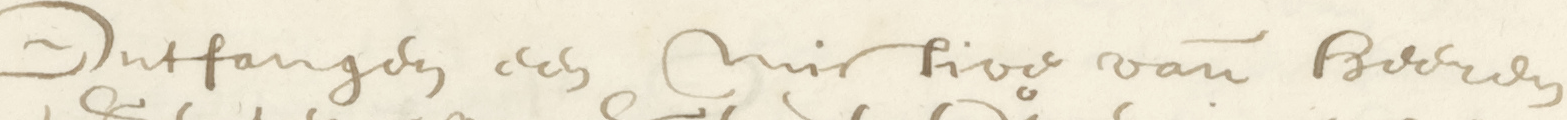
Ontfangen een Missive van Heeren
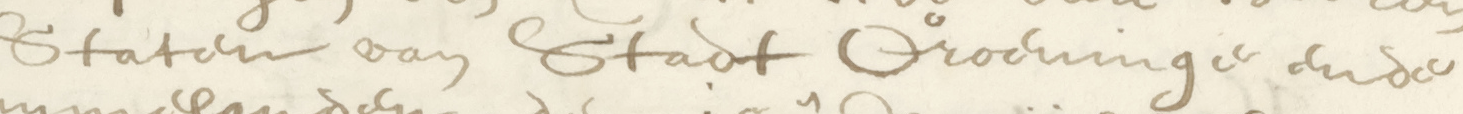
Staten van Stadt Groeninge ende
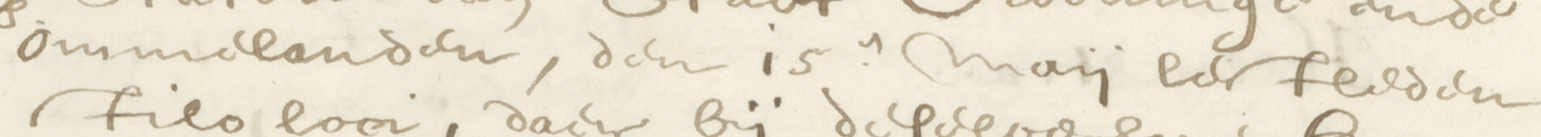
Ommelanden, den 15en. Maij lestleden,
